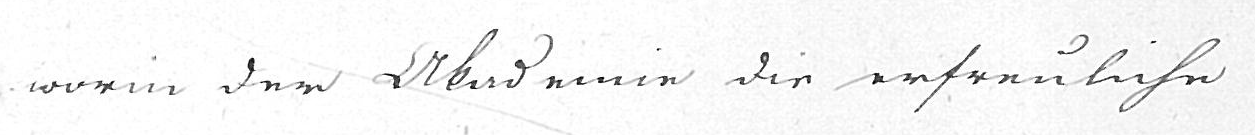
worin der Akademie die erfreuliche
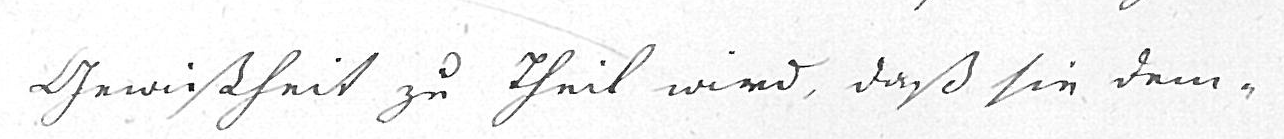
Gewißheit zu Theil wird, daß sie dem-
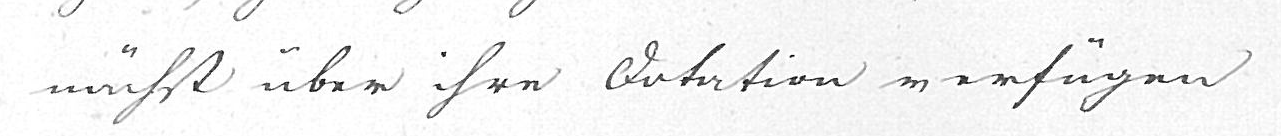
nächst über ihre Dotation verfügen
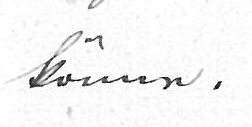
könne.
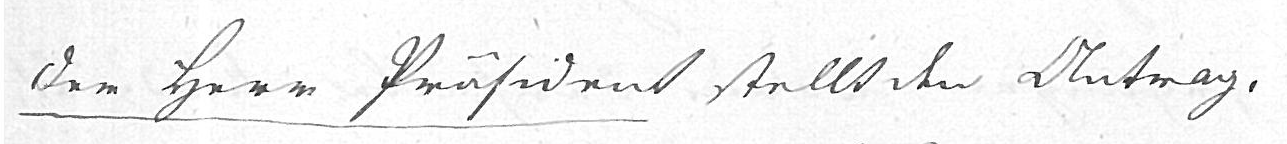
Der Herr Präsident stellt den Antrag,
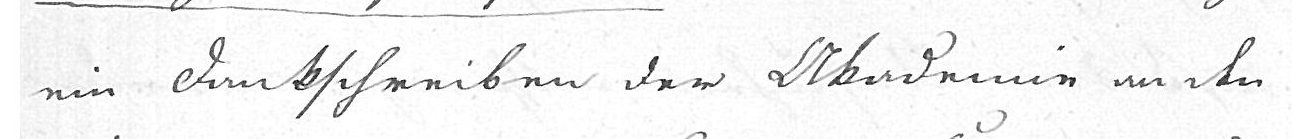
ein Dankschreiben der Akademie an den
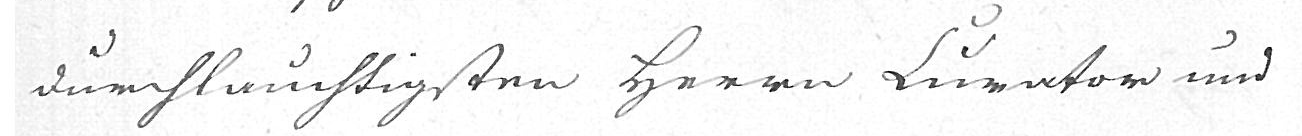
durchlauchtigsten Herrn Curator und
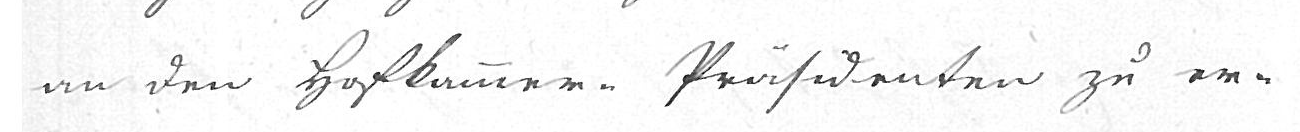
an den Hofkammer-Präsidenten zu er-
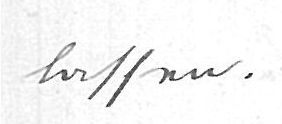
lassen
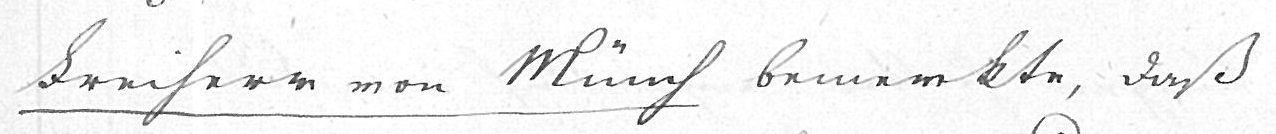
Freiherr von Münch bemerkte, daß
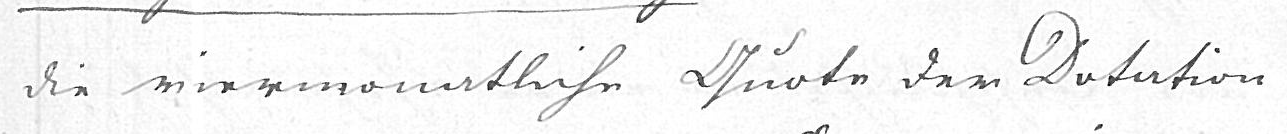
die viermonatliche Quote der Dotation
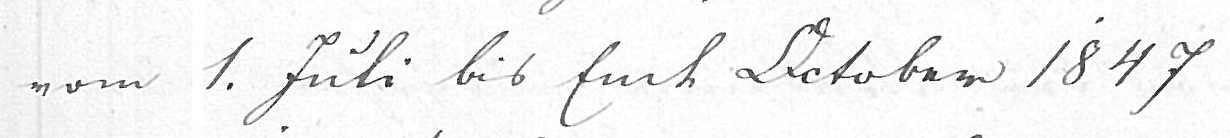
vom 1. Juli bis Ende October 1847
